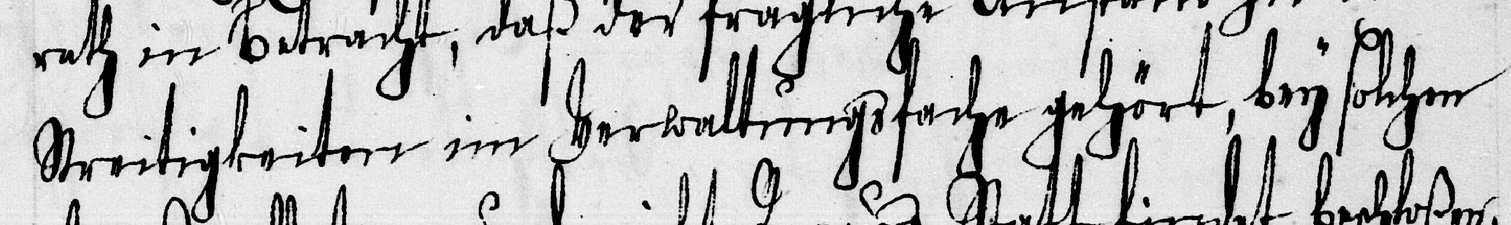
Streitigkeiten im Verwaltungsfache gehört, bey solchen
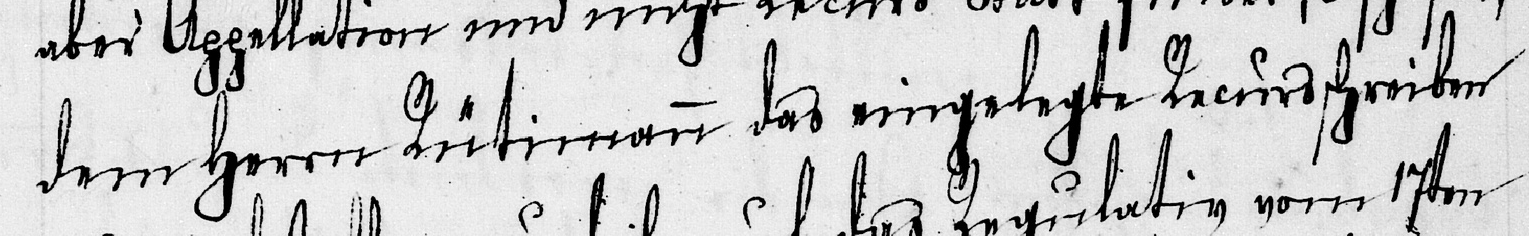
dem Herrn Rütimann das eingelegte Recursschreiben
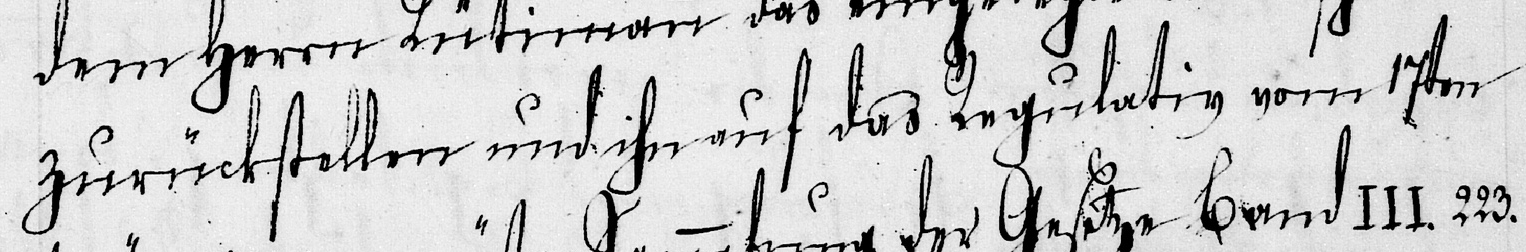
zurückstellen und ihn auf das Regulativ vom 17ten
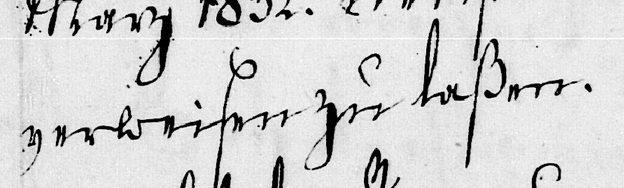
verweisen zu laßen.
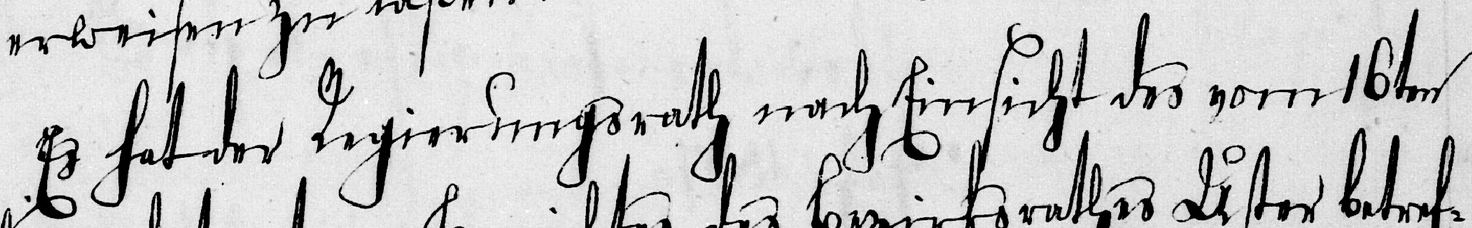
Es hat der Regierungsrath nach Einsicht des vom 16ten.
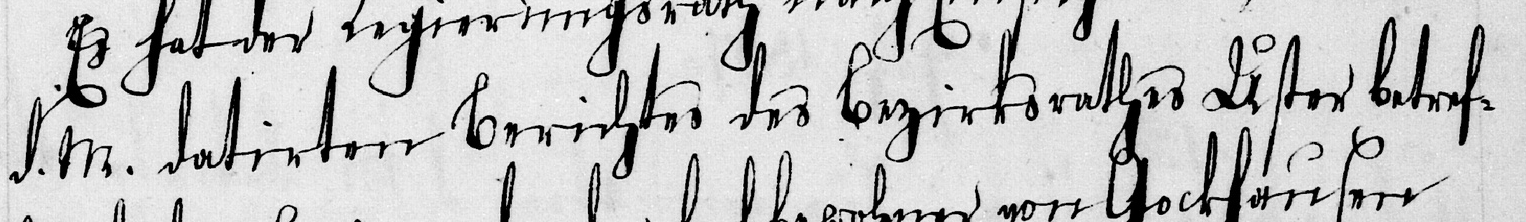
d. M. datirten Berichtes des Bezirksrathes Uster betref¬
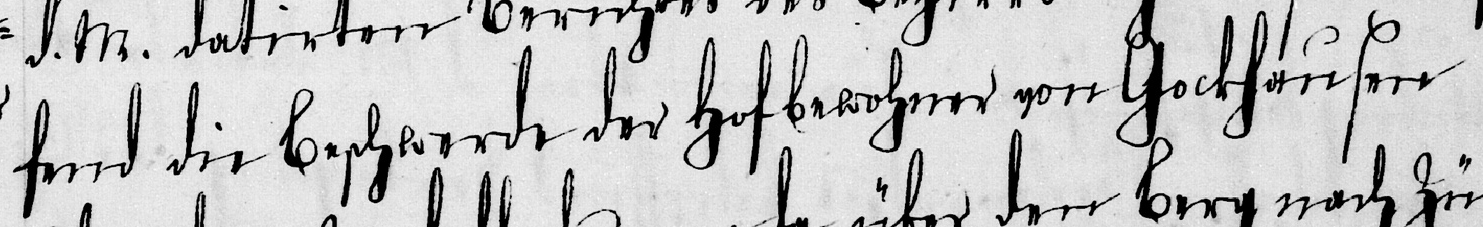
fend die Beschwerde der Hofbewohner von Gockhausen
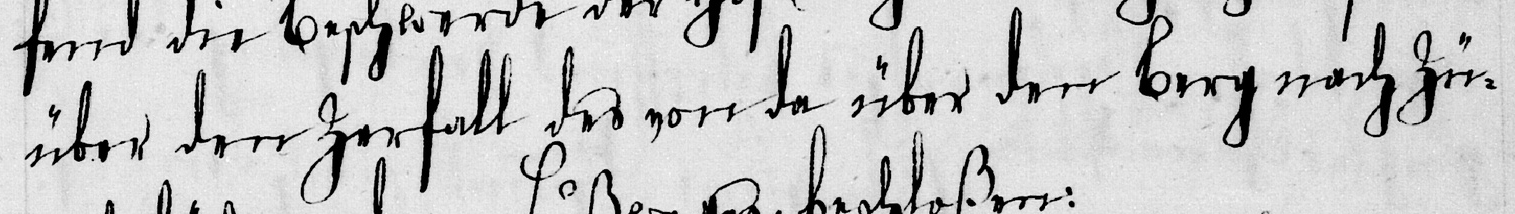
über den Zerfall des von da über den Berg nach Zü¬
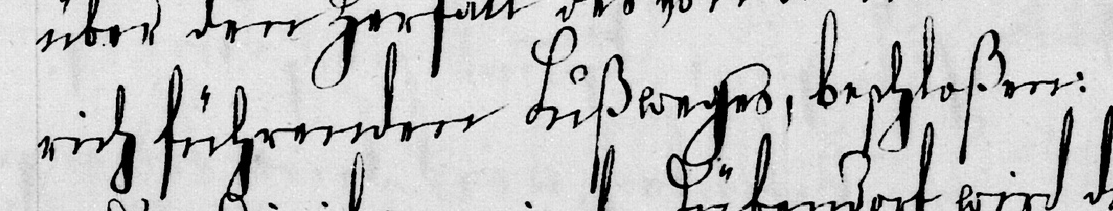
rich führenden Fußweges, beschloßen:
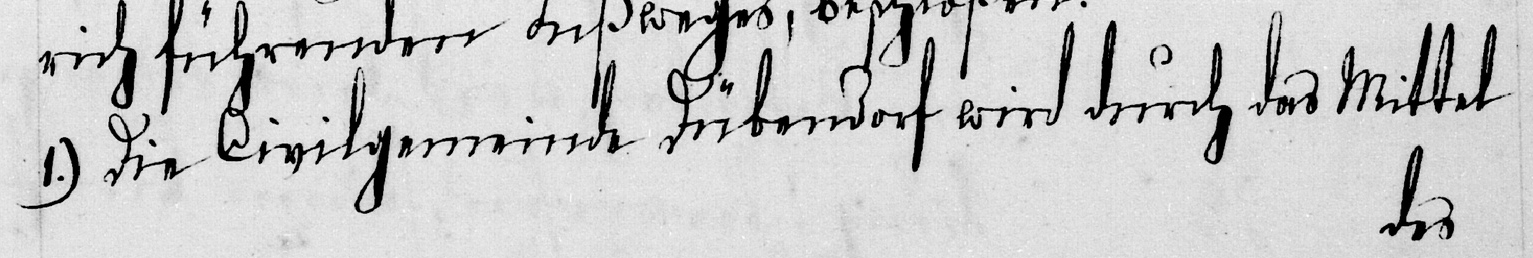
1.) Die Civilgemeinde Dübendorf wird durch das Mittel
